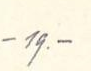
19
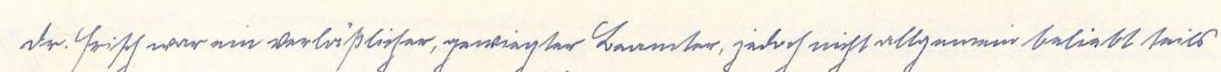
Dr. Frisch war ein verlässlicher, gewiegter Beamte, jedoch nicht allgemein beliebt teils
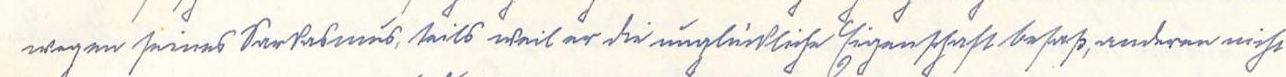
wegen seines Sarkasmus, teils weil er die unglückliche Eigenschaft besaß, anderen nicht
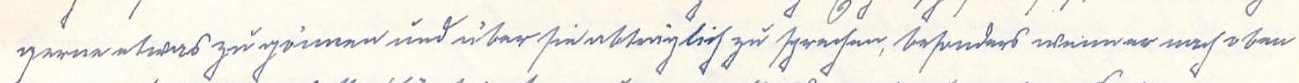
gerne etwas zu gönnen und über sie abträglich zu sprechen, besonders wenn er nach oben
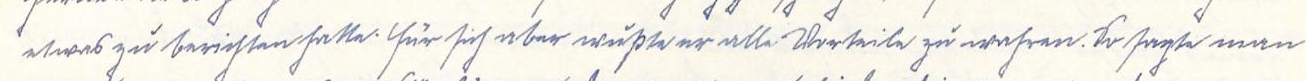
etwas zu berichten hatte. Für sich aber wusste er alle Vorteile zu wahren. So sagte man
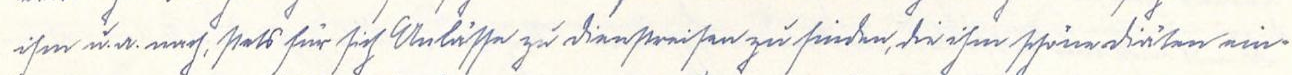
ihm u. a. nach, stets für sich Ansätze zu Dienstreisen zu finden, die ihm schöne Diäten ein-
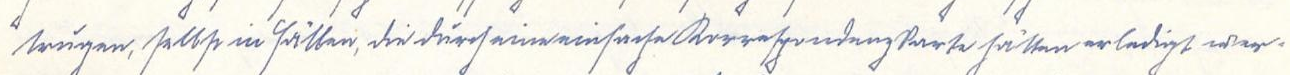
trugen, selbst in Fällen, die durch eine einfache Korrespondenzkarte hätten erledigt wer-
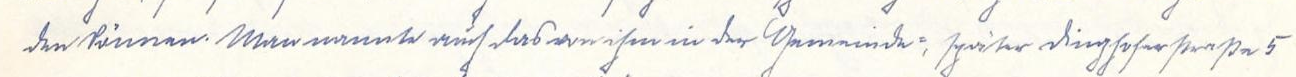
den können. Man benannte auch das von ihm in der Gemeinde- später Dinghoferstraße 5
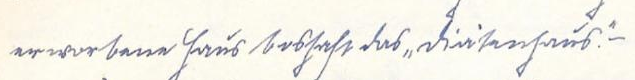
erworbene Haus boshaft das „Diätenhaus“.-
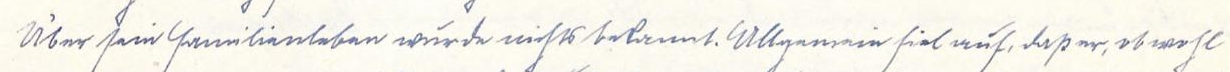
Über sein Familienleben wurde nichts bekannt. Allgemein fiel auf, daß er, obwohl
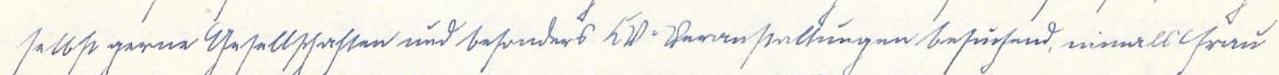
selbst gerne Gesellschaften und besonders CV-Veranstaltungen besuchend, niemals Frau
